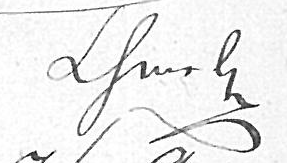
Chmel
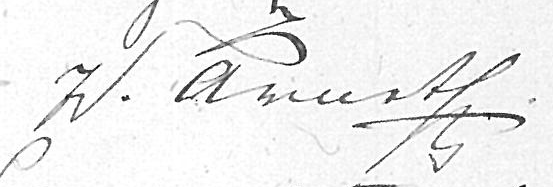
J. Arneth
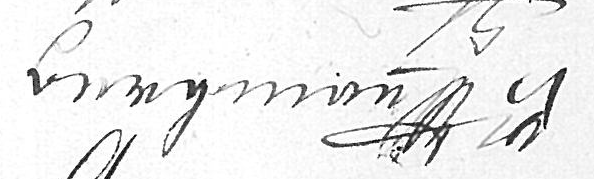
Bergmann
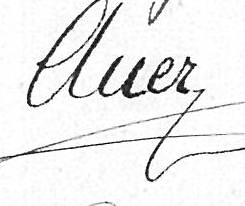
Auer
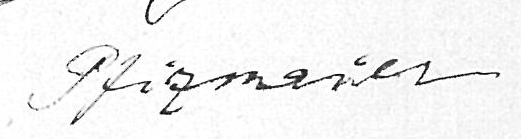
Pfizmaier
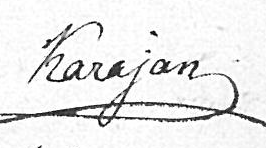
Karajan
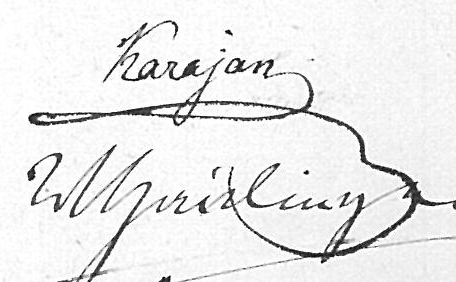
WHaidinger
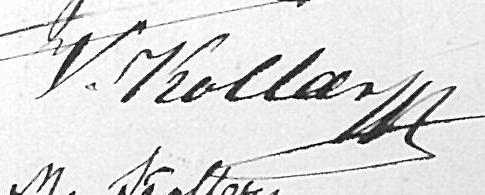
V. Kollar
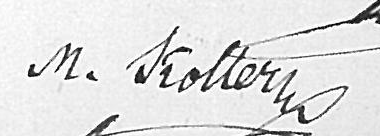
M. Koller
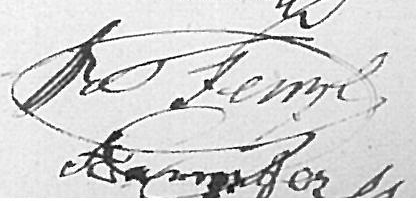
Ed. Fenzl
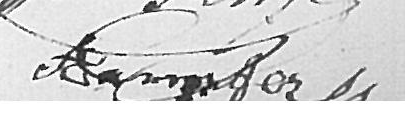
Stampfer
